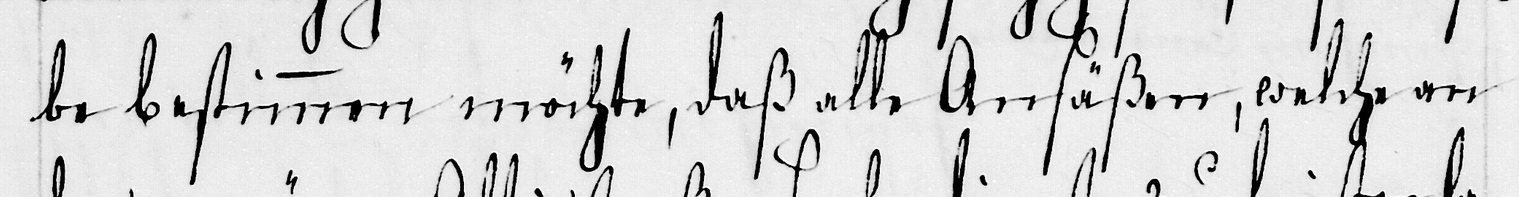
lbe bestimmen möchte, daß alle Ansäßen, welche an
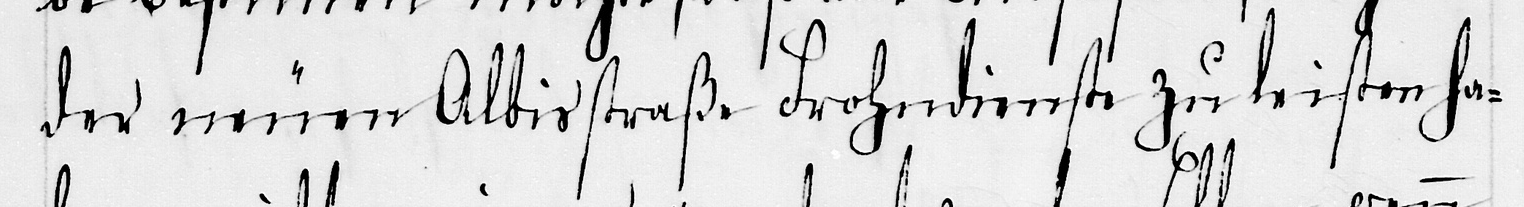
der neuen Albisstraße Frohndienste zu leisten ha¬
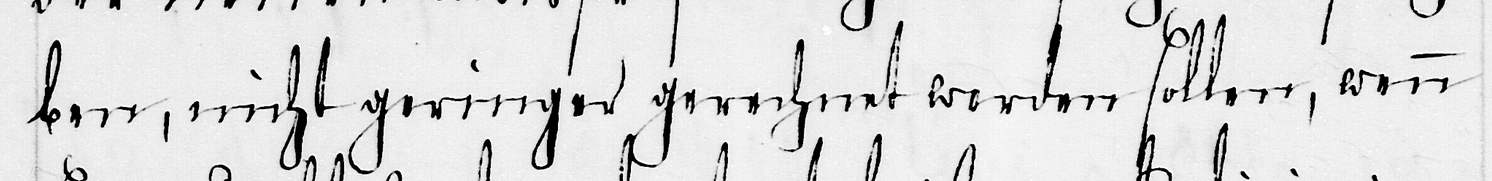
ben, nicht geringer gerechnet werden sollen, wenn
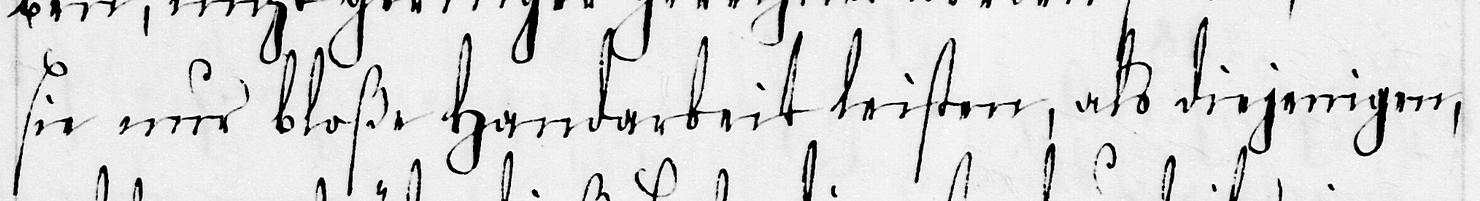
sie nur bloße Handarbeit leisten, als diejenigen,
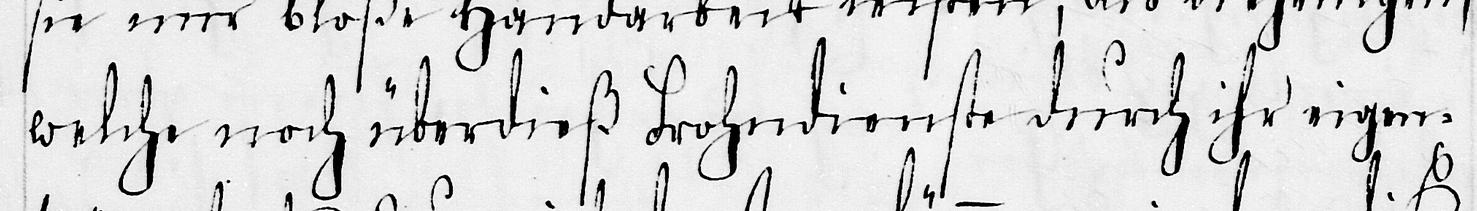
welche noch überdieß Frohndienste durch ihr eigen¬
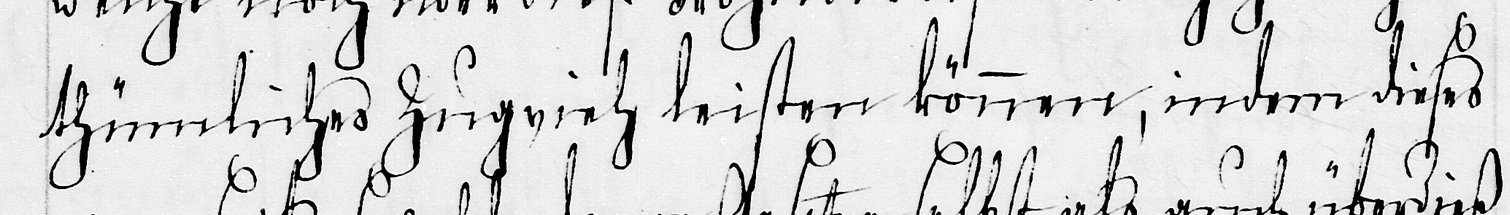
thümliches Zugvieh leisten können, indem dieses
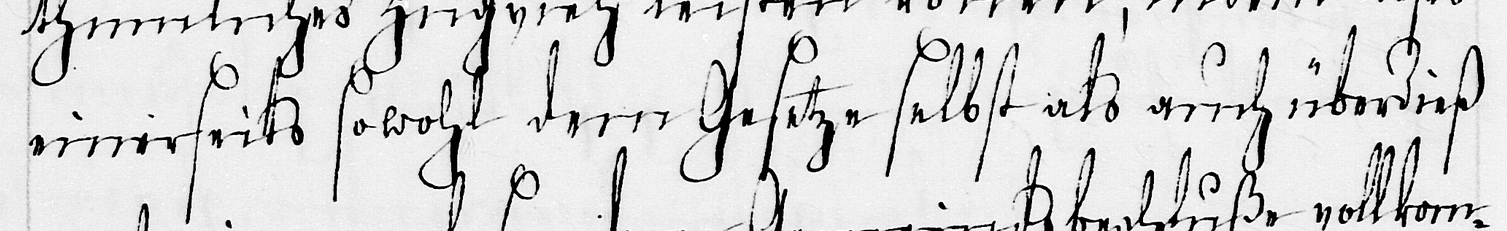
einerseits sowohl dem Gesetze selbst als auch überdieß
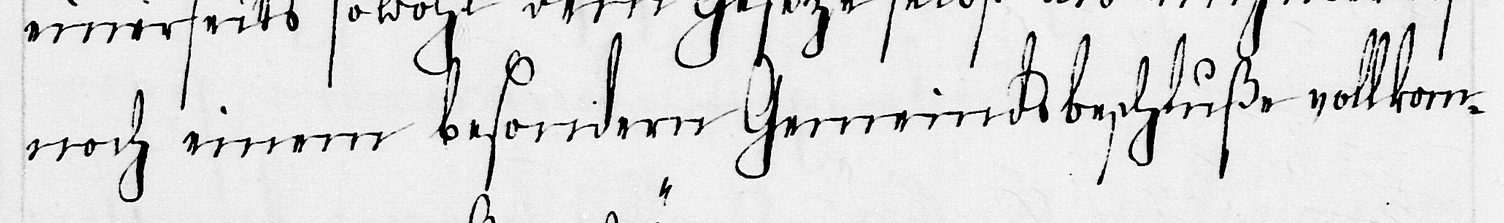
noch einem besondern Gemeindsbeschluße vollkom¬
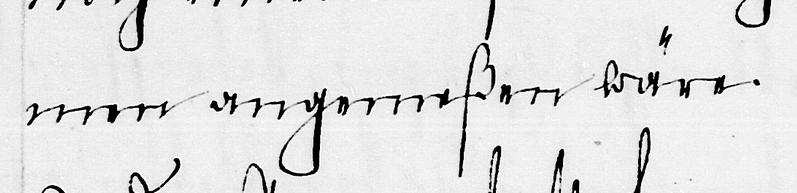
men angemeßen wäre.
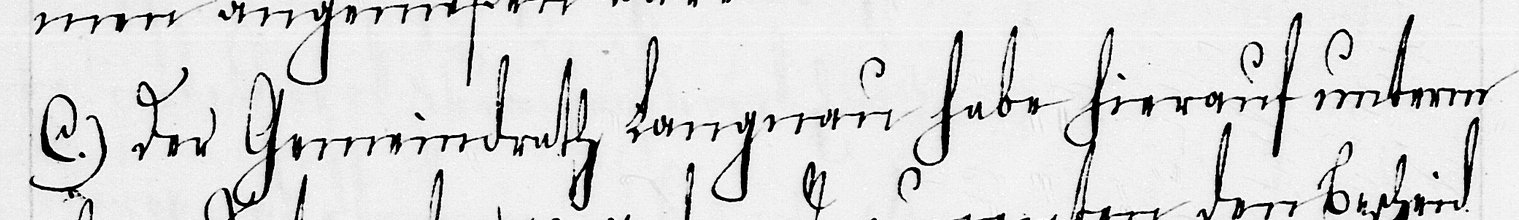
C.) Der Gemeindrath Langnau habe hierauf unterm
